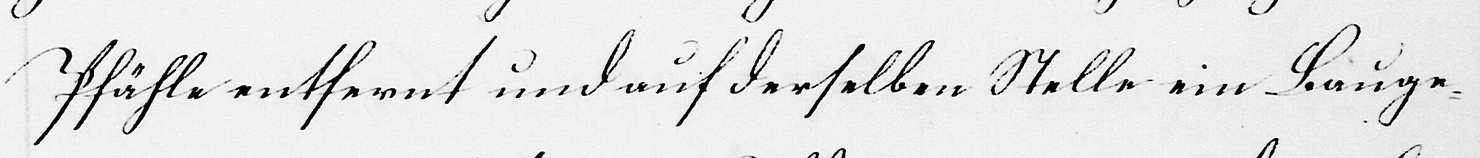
Pfähle entfernt und auf derselben Stelle ein Bauge¬
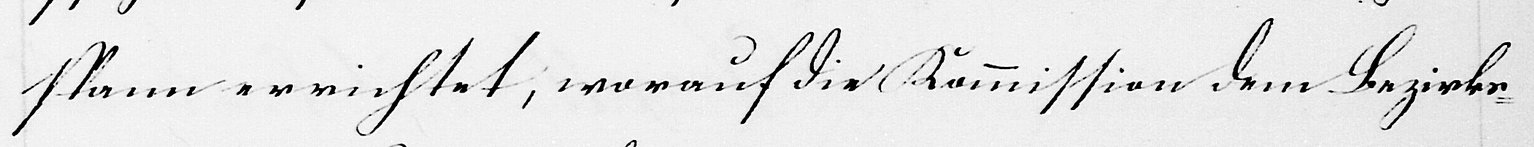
spann errichtet, worauf die Kommission dem Bezirks¬
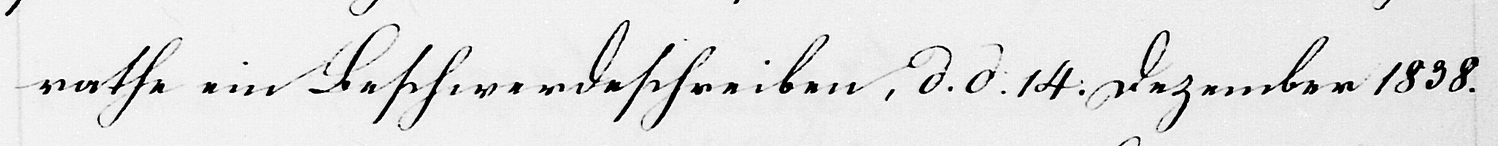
rathe ein Beschwerdeschreiben, d. d. 14. Dezember 1838.
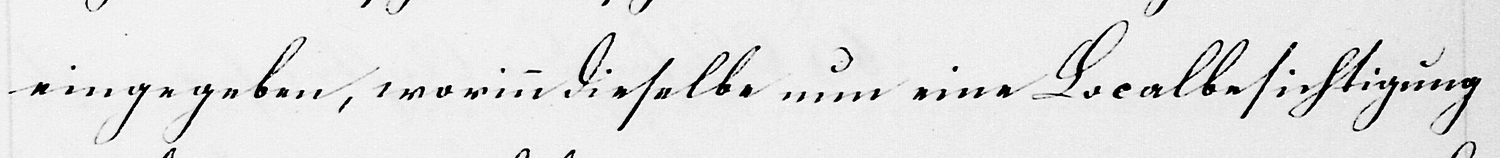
eingegeben, worinn dieselbe nun eine Localbesichtigung
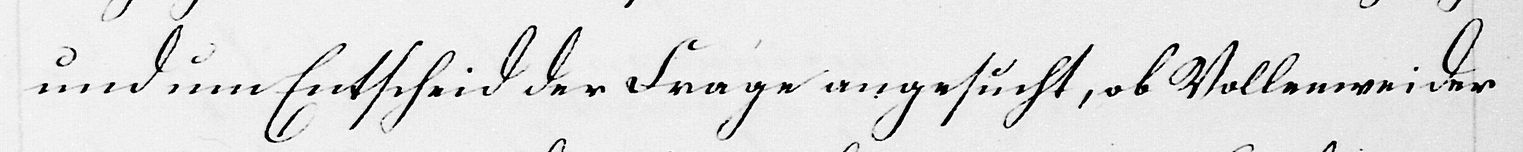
und um Entscheid der Frage angesucht, ob Vollenweider
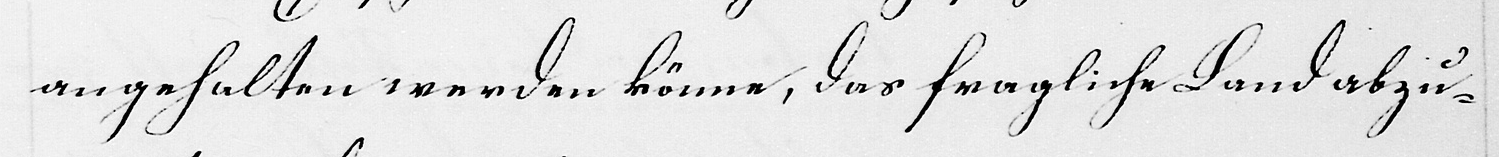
angehalten werden könne, das fragliche Land abzu¬
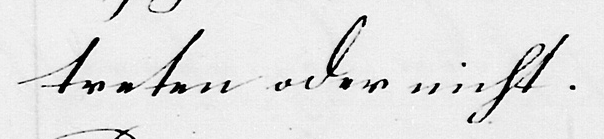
treten oder nicht.
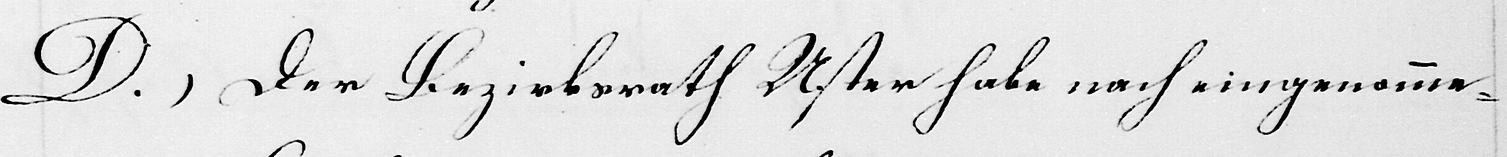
D.) Der Bezirksrath Uster habe nach eingenomme¬
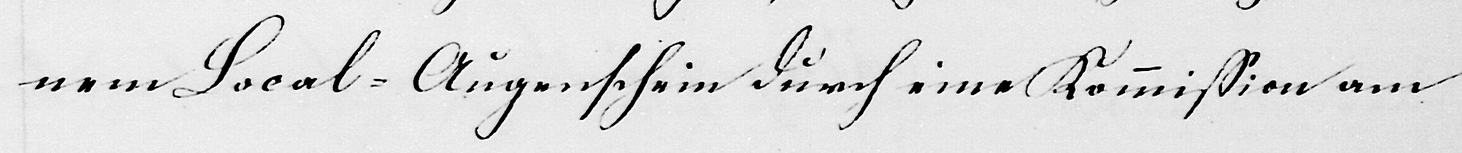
nem Local-Augenschein durch eine Kommißion am
